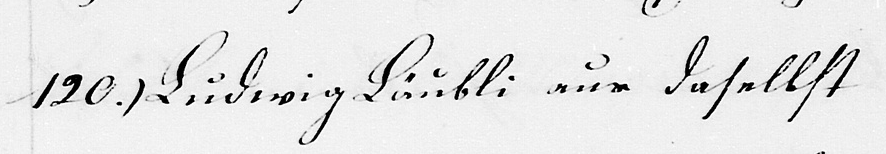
120.) Ludwig Läubli aus daselbst,
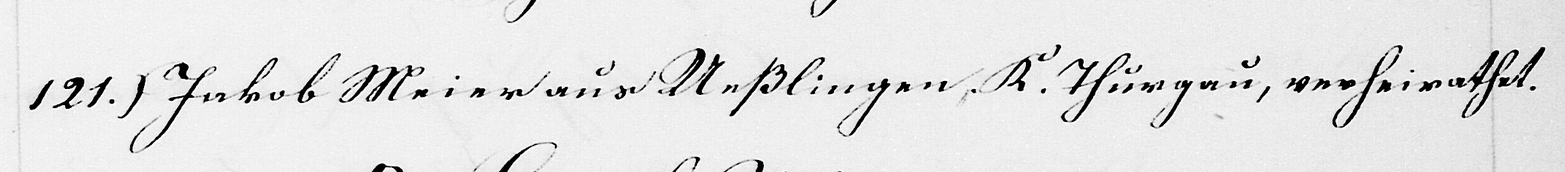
121.) Jakob Meier aus Ueßlingen. K. Thurgau, verheirathet.
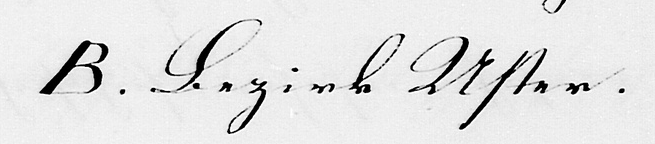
B. Bezirk Uster.
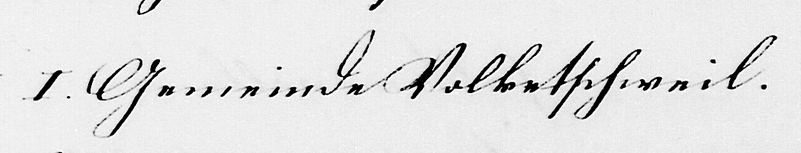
I. Gemeinde Volketschweil.
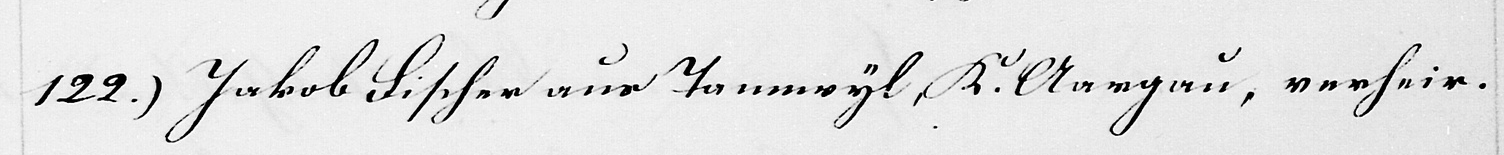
122.) Jakob Fischer aus Tannwyl, K. Aargau, verheir.
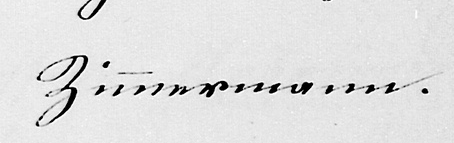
Zimmermann.
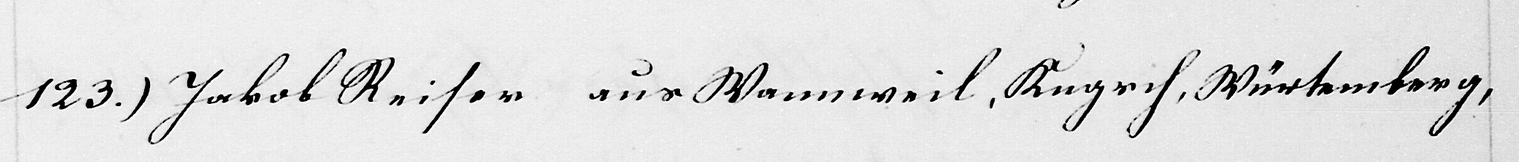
123.) Jakob Reiser aus Wannweil, Kngrch, Würtemberg,
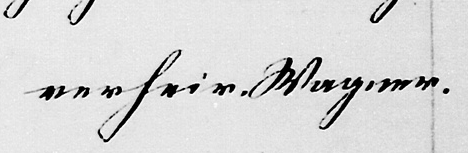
verheir. Wagner.
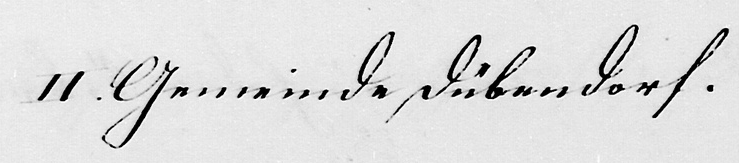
II. Gemeinde Dübendorf.
